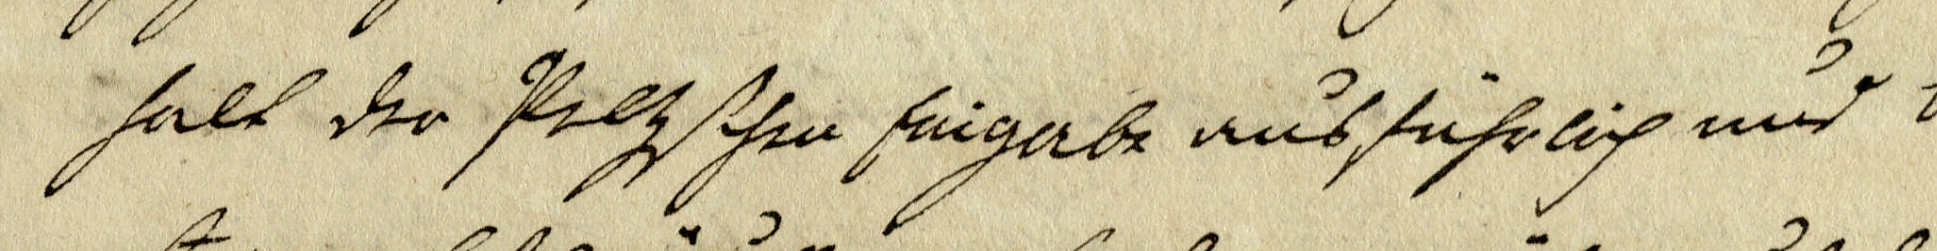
halt der Pelzschen Eingabe ausführlich und be
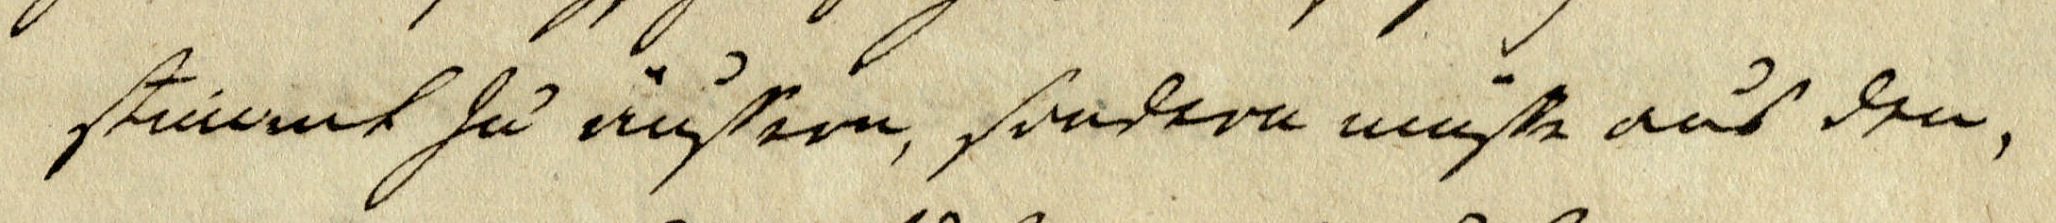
stimmt zu äussern, sondern müsse aus den,
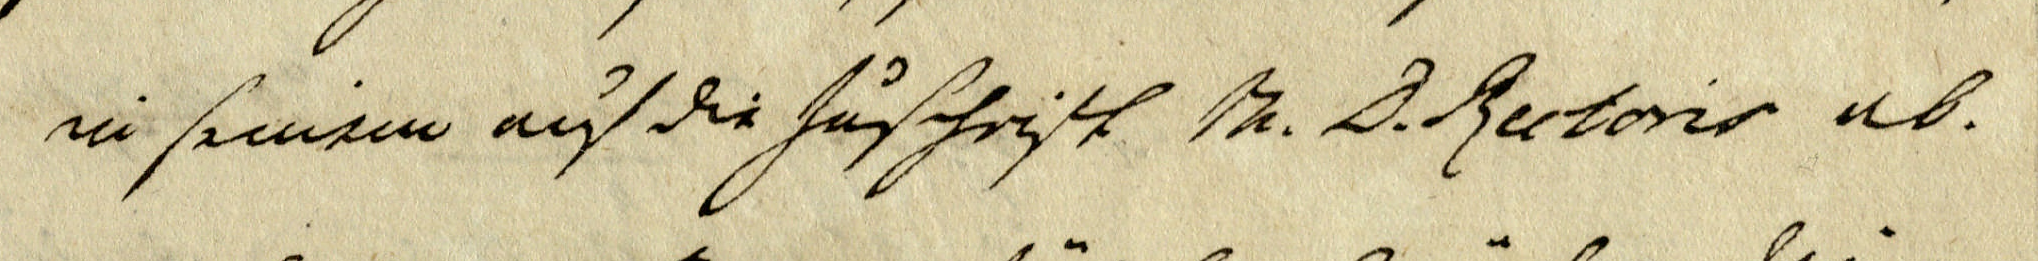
in seinem auf die Zuschrift M. D. Rectoris ab¬
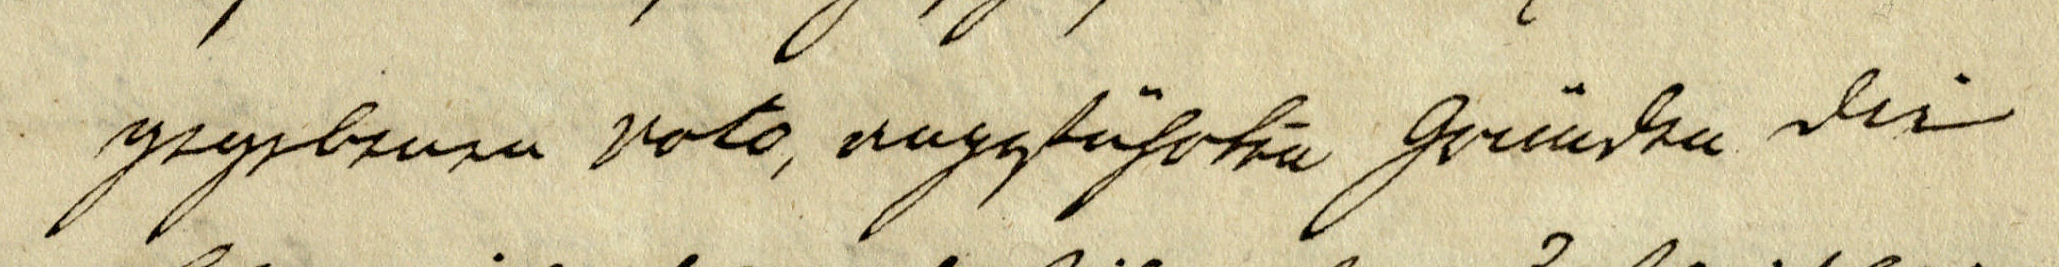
gegebenen voto, angeführten Gründen die
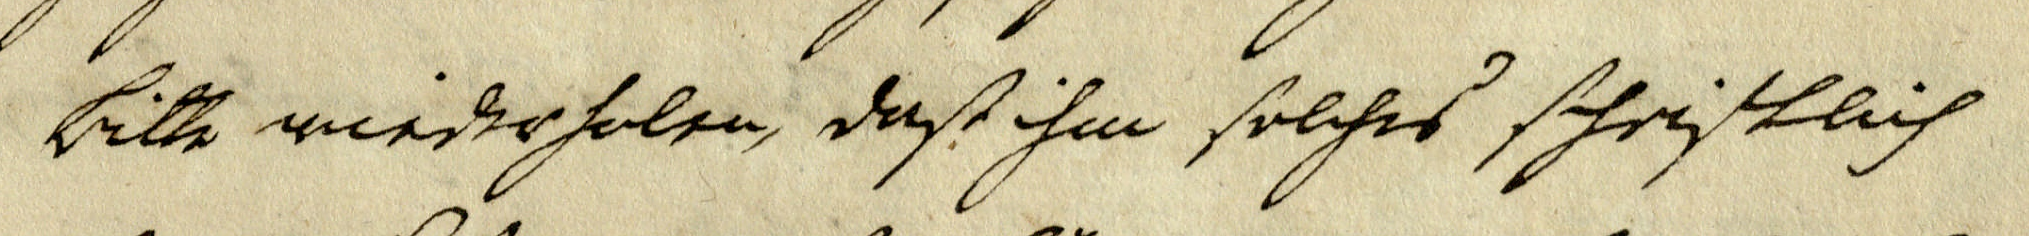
Bitte wiederholen, daß ihm solches schriftlich
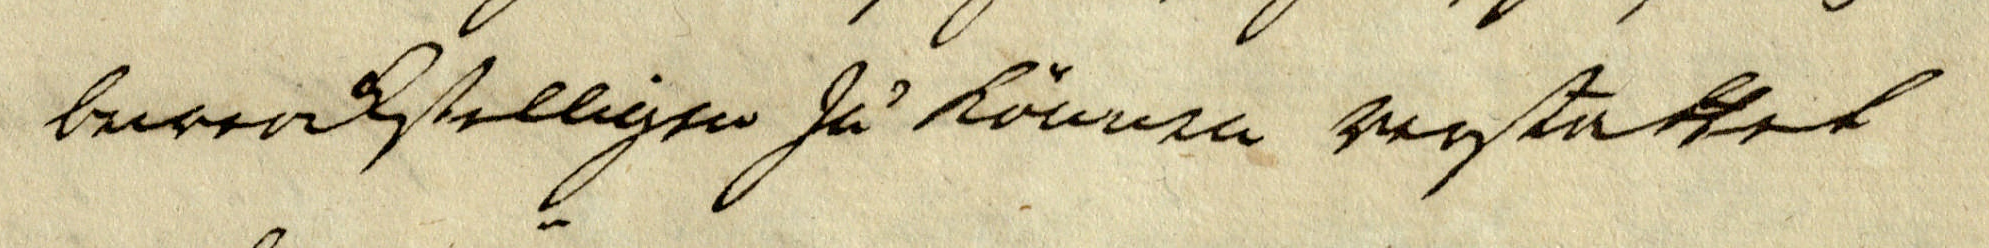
bewerckstelligen zu können verstattet
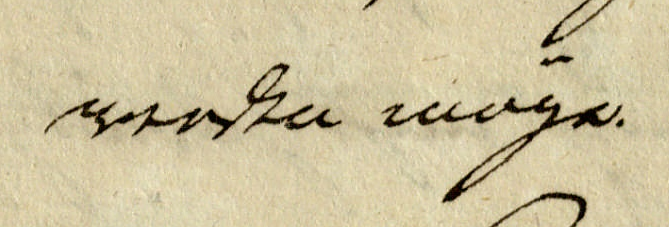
werden möge.
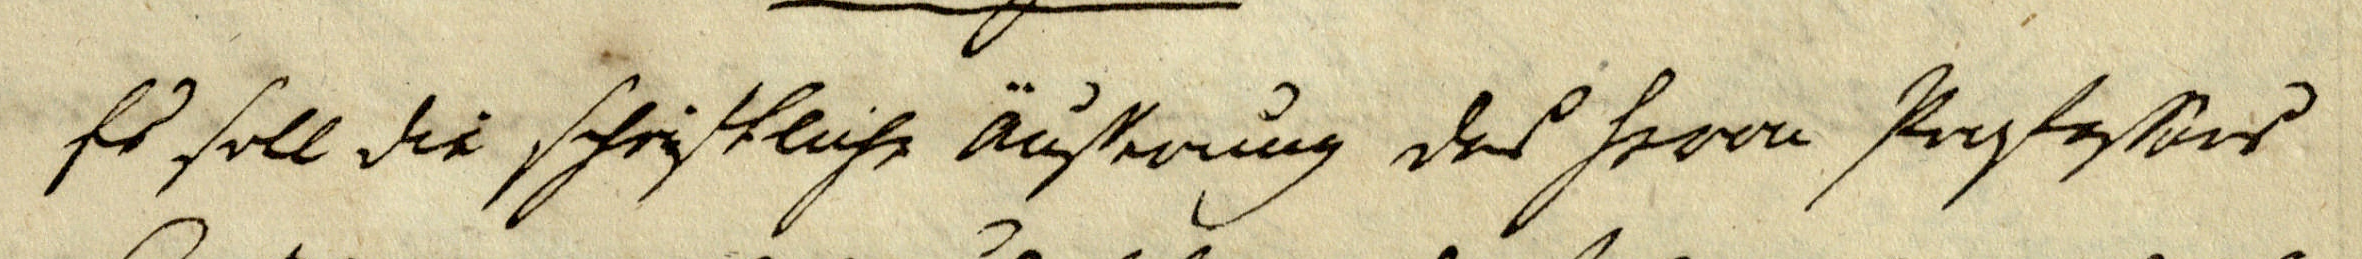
Es soll die schriftliche Äusserung des Herrn Professors
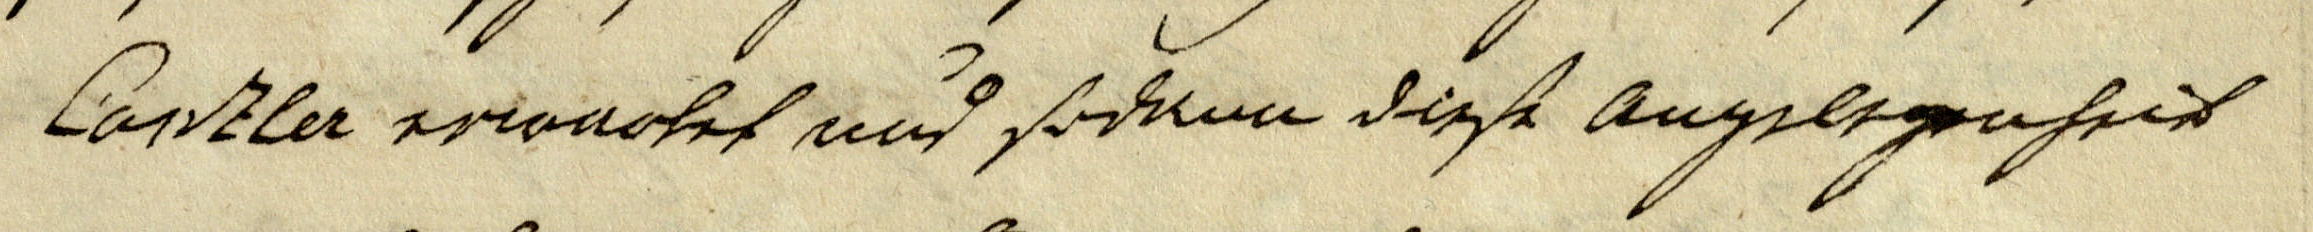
Canzler erwartet und sodann diese Angelegenheit
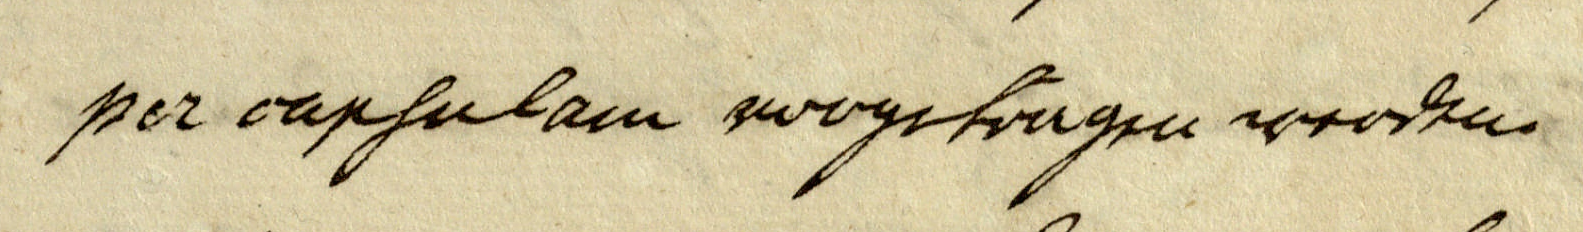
per capsulam vorgetragen werden.
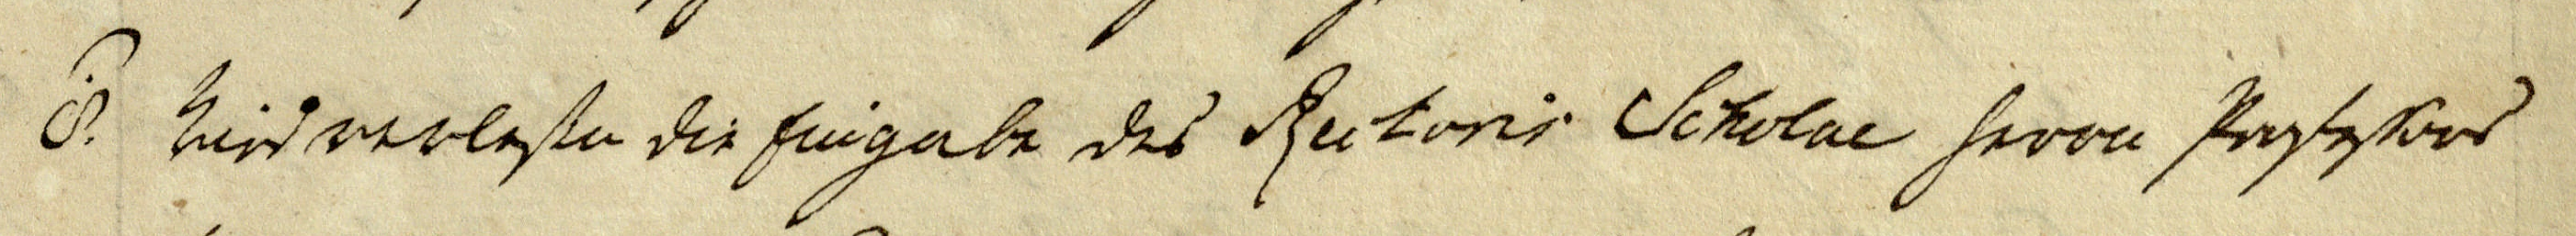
8. Wird verlesen die Eingabe des Rectoris Scholae Herrn Professors
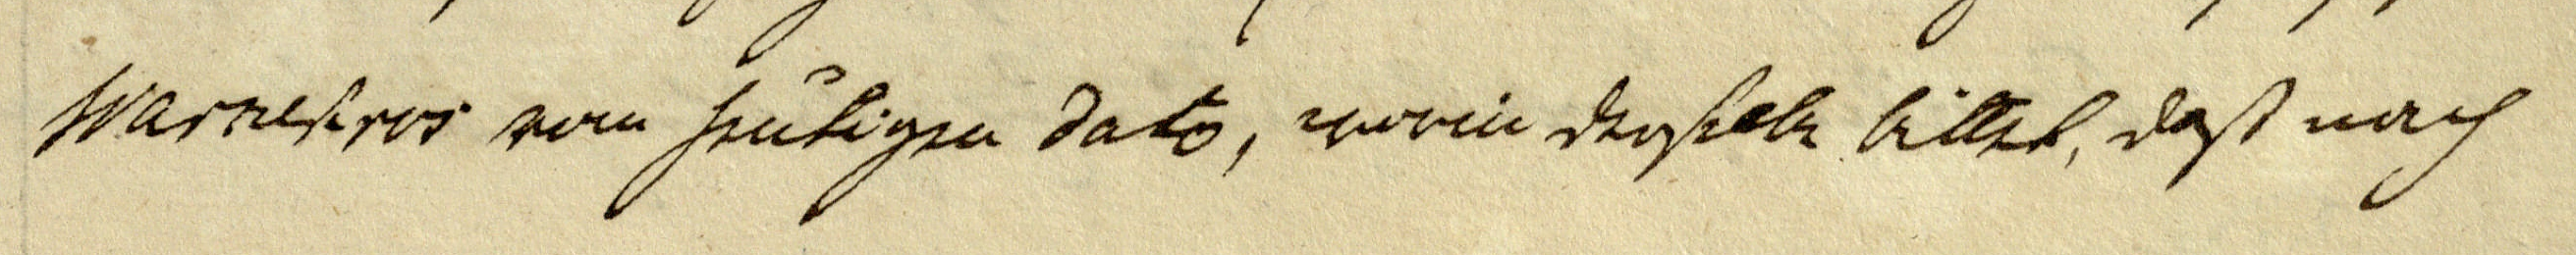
Warnekros vom heutigen dato, worin derselbe bittet, daß nach
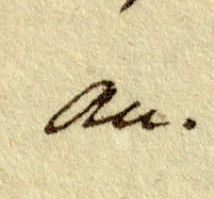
An¬
